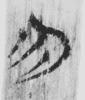勿
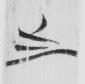之
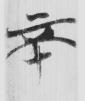不
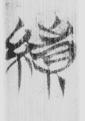{糸出貝}
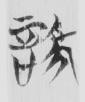{言象}
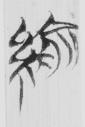{糸俞}
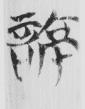諒
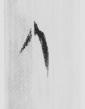人
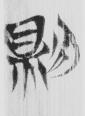則
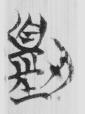{頁巠刃}
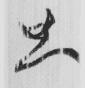也
